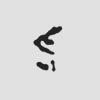𠭁
